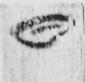日
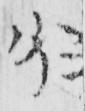小人
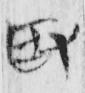取
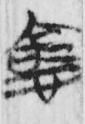愴
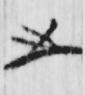之
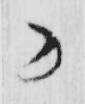刀
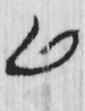㠯（以）
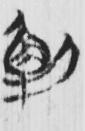解
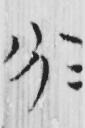小人
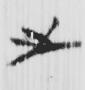之
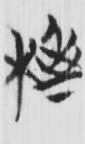桎
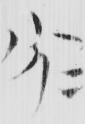小人
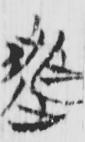逃
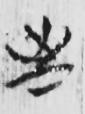至
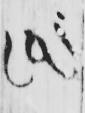州
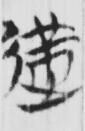巷
